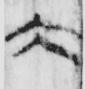大
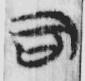司
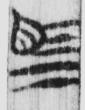馬
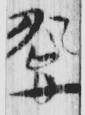○（悼）
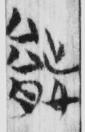○（滑）
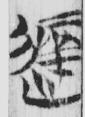𬨭（將）
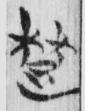楚
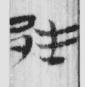邦
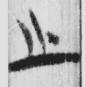之
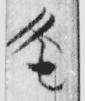帀（師）
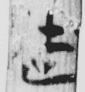徒
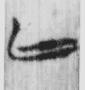㠯（以）
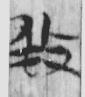○（救）
